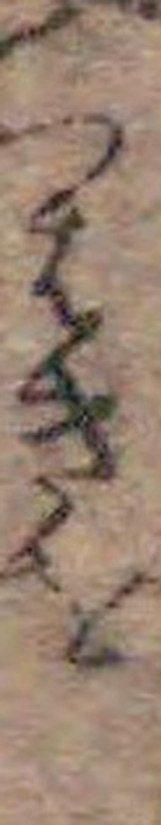つはきを
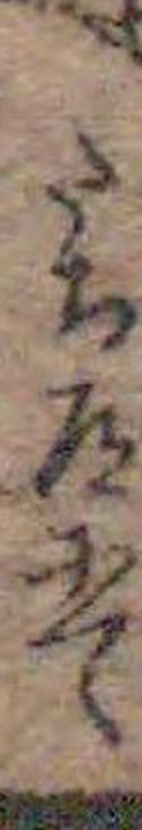たち道にて
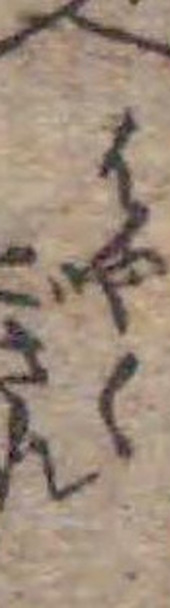はやく
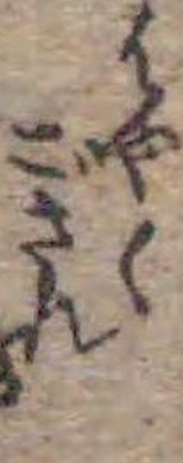はやく
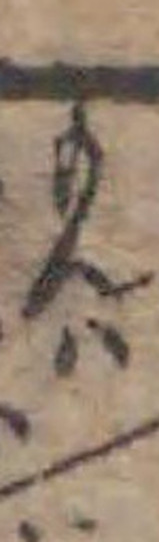もんは
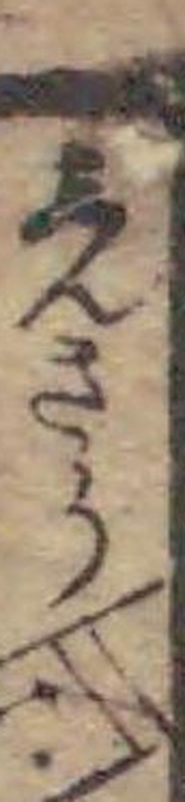しんきう
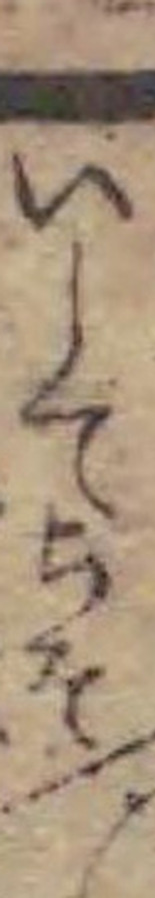いしてちそ
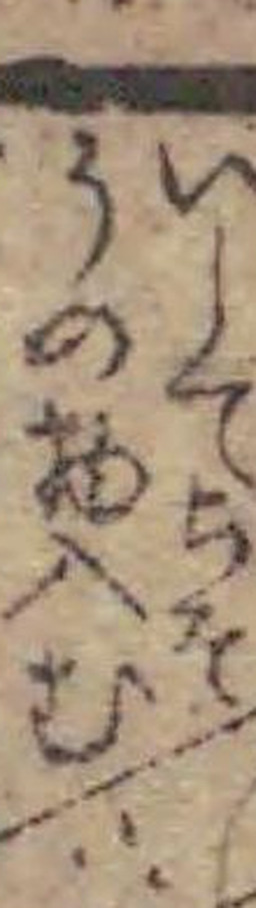うの物入む
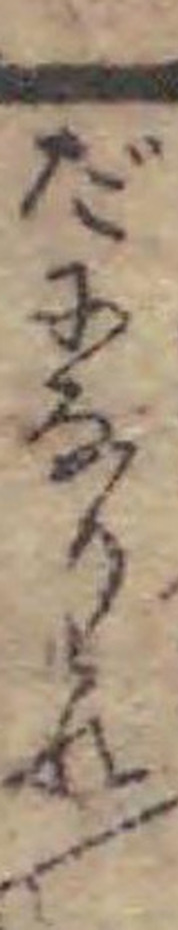だになりけれ
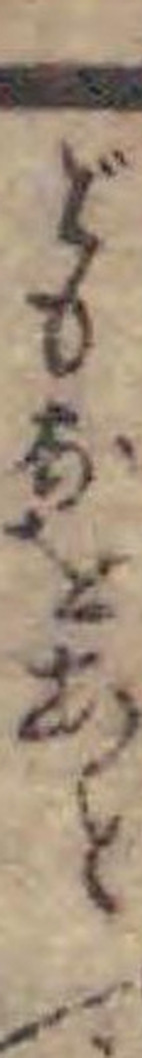どもなをあと
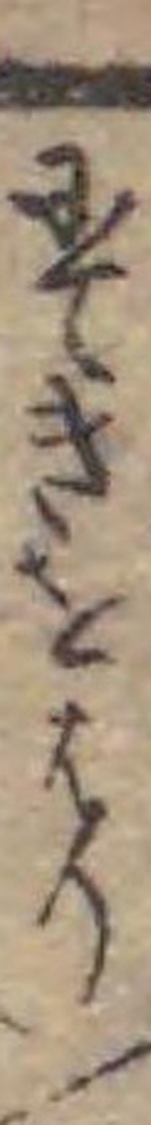にてきをはり
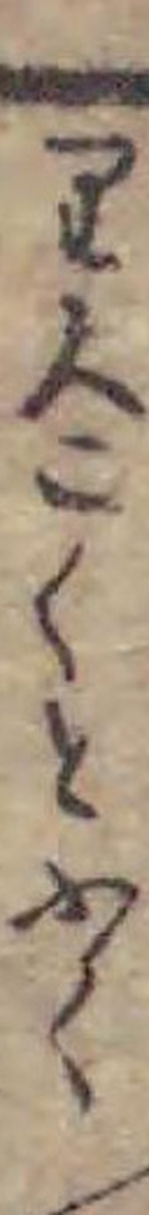り人こくとふく
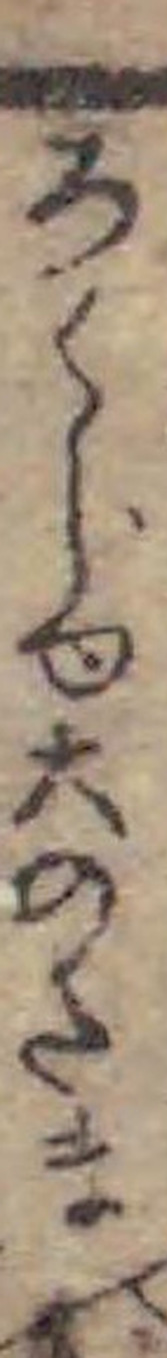ろくじゆ大のたま
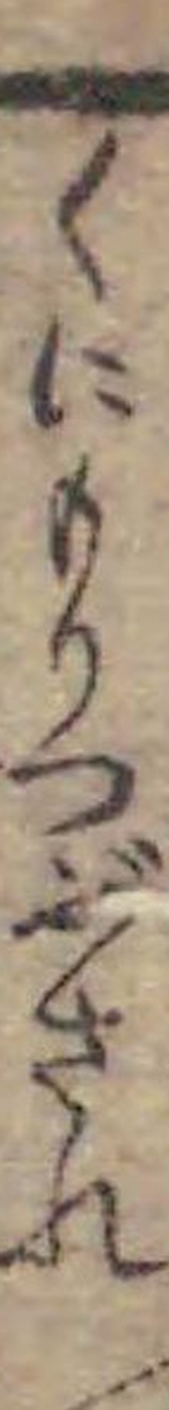くにもりつぶされ
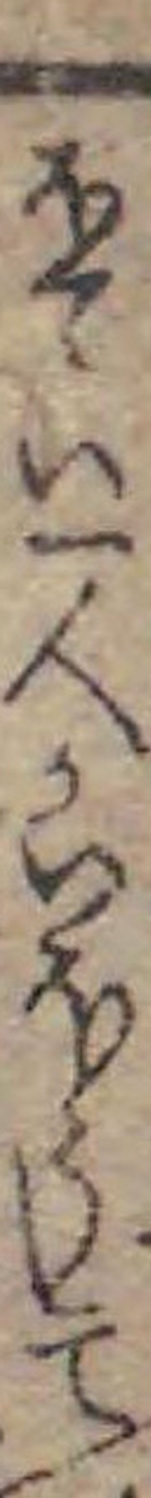ほてい一人かいほうして
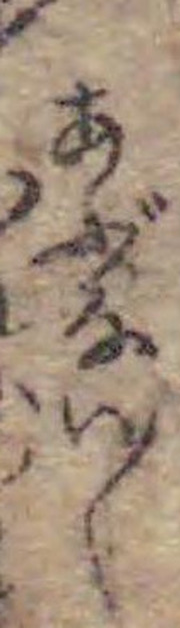あぶない〳〵
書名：蛭子大黒壮年過 : 2巻
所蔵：国立国会図書館 National Diet Library, JAPAN
